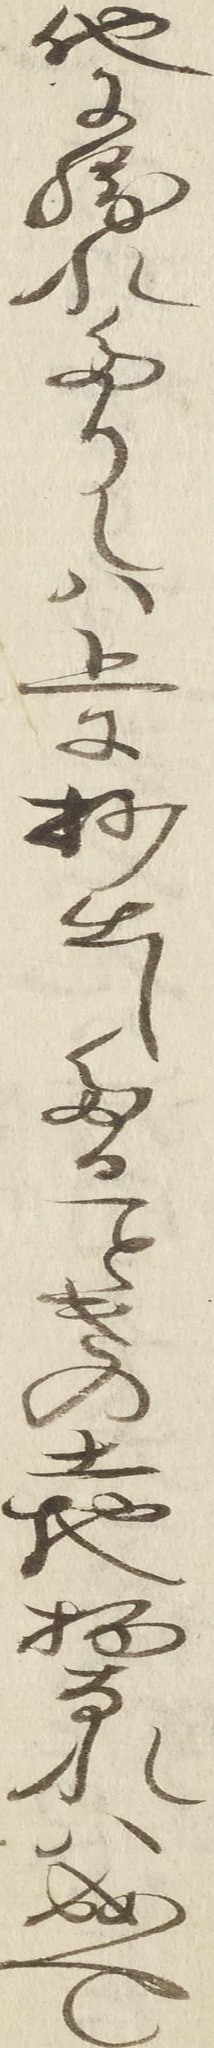他に勝れたりしは上に抄出したることきの土地柄なれは成へし
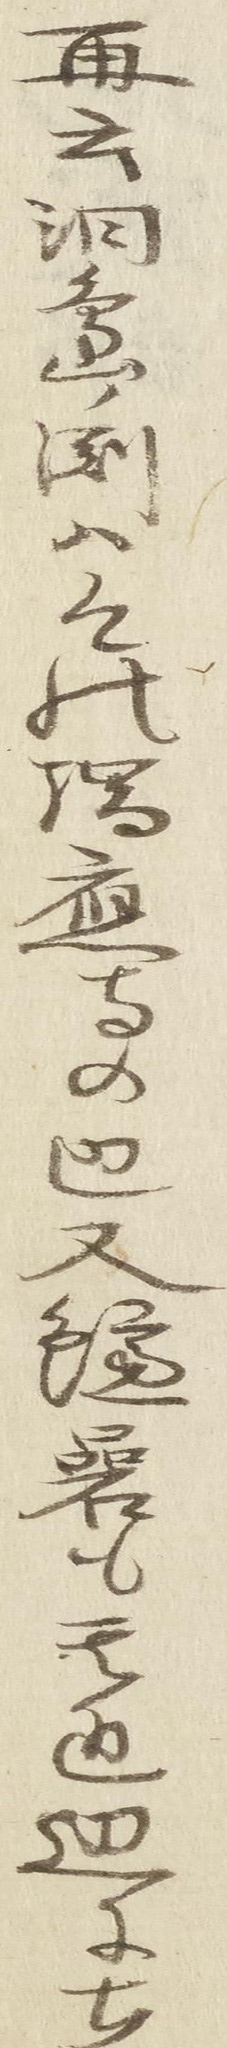再云洞島ノ渕は今の瑞応寺の辺又鱸碞も其辺辺に在
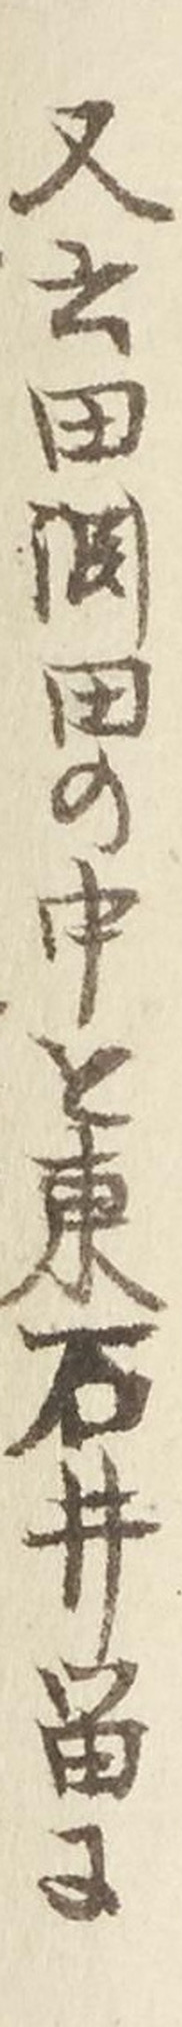又云田渕田の中を東石井留に
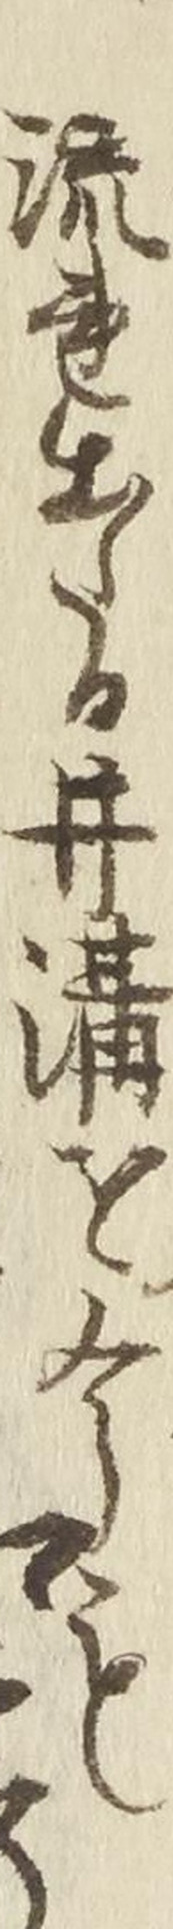流れ出たる井溝を今も
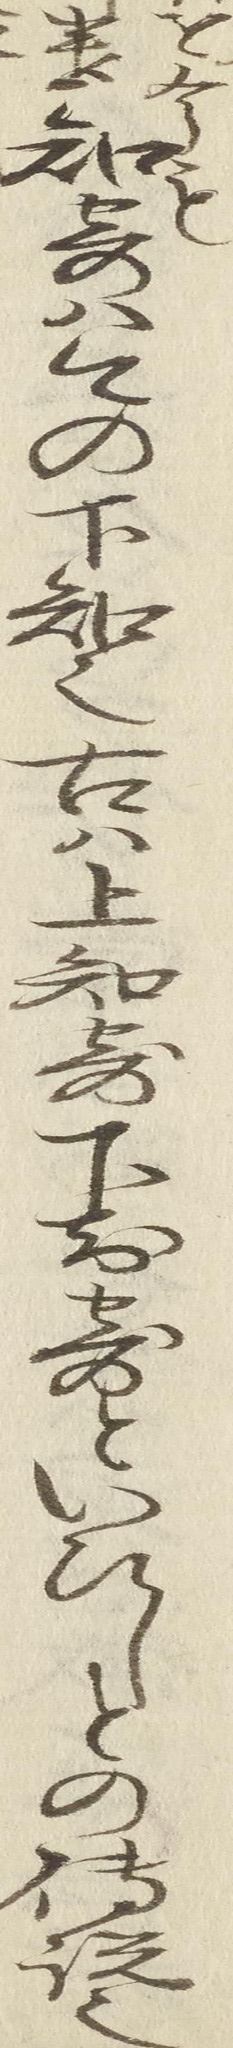知寄は今の下知也古は上知寄下知寄といひしとの伝説也
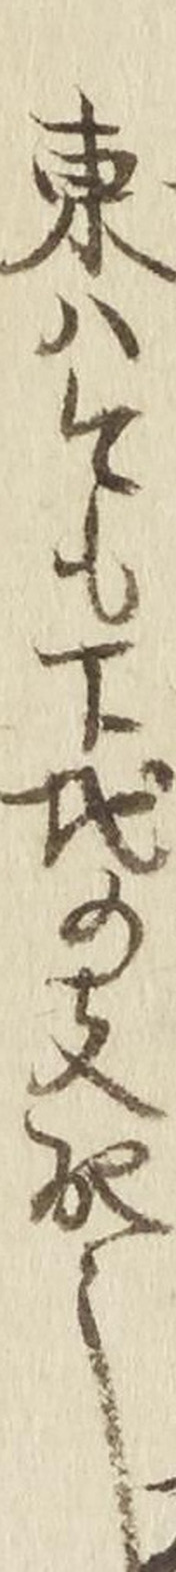東は今も下地の支配也
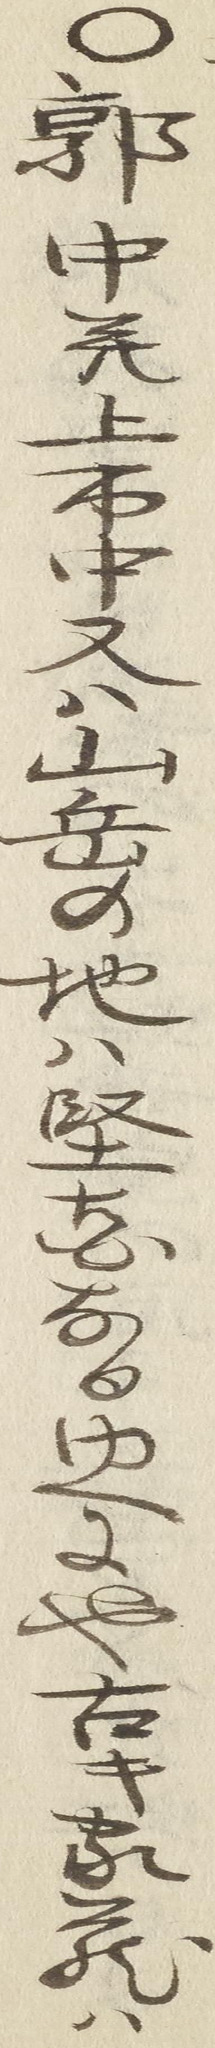○郭中并上市中又は山岳の地は堅固なるゆへにや古キ家蔵は
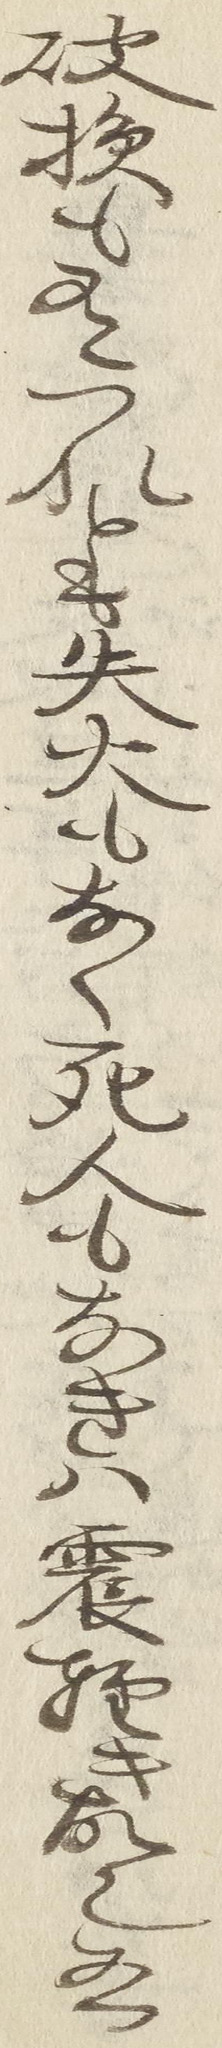破損も有つれとも失火もなく死人もなきは震軽キ故也有
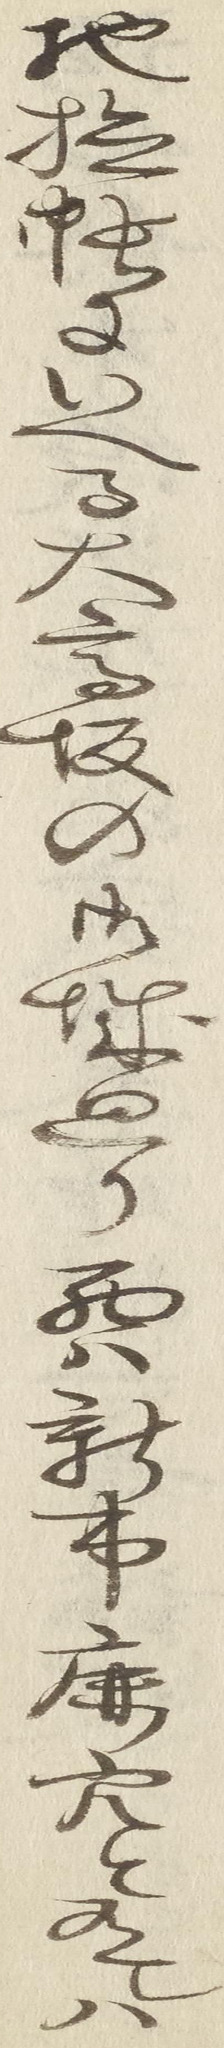地検帳にいへる大高坂の御城廻り西は新市鹿穴と有レは
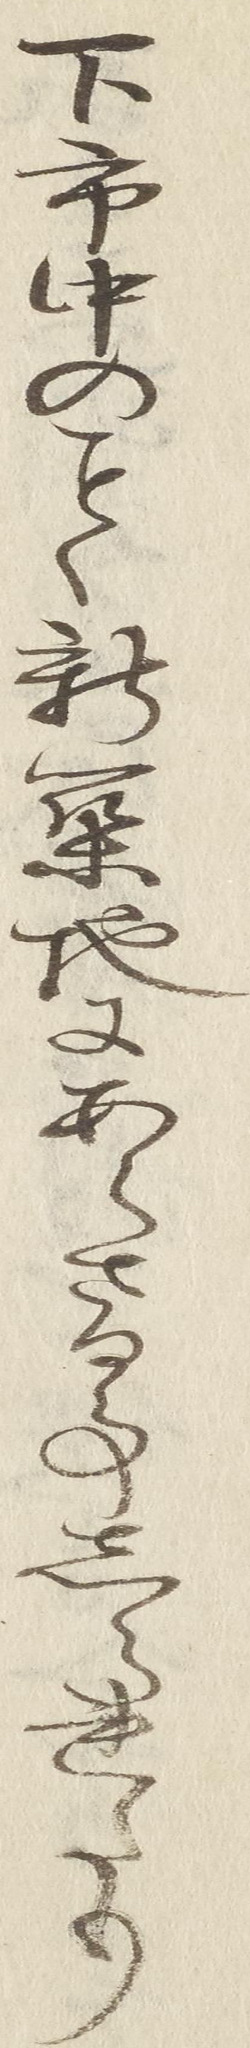下市中のことく新築地にあらさることしられたり
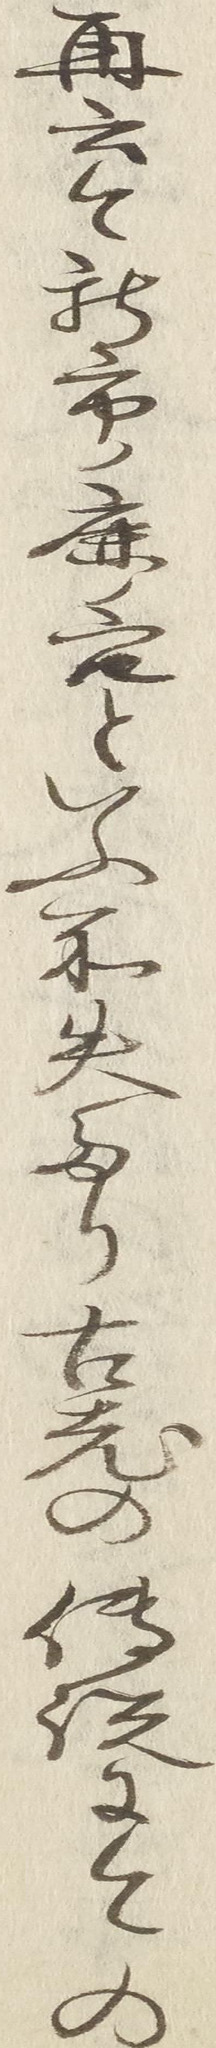再云今新市ノ鹿ノ穴といふ所失たり古老の伝説に今の
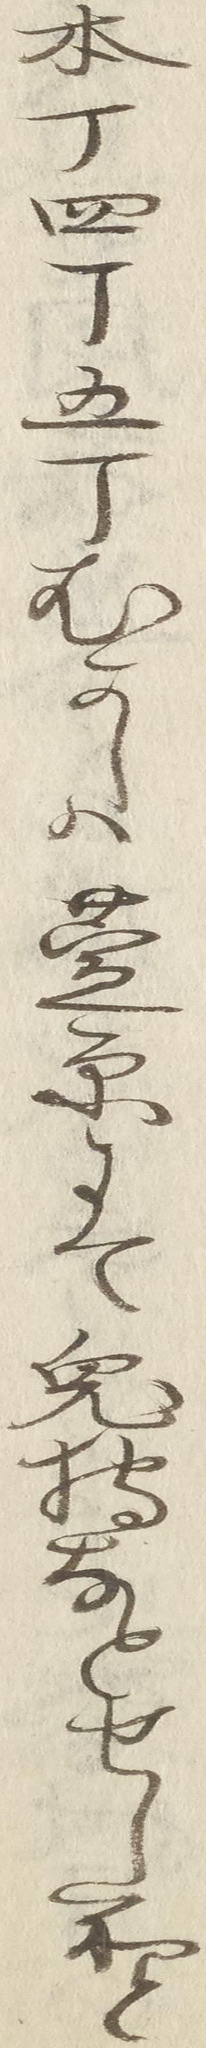本丁四丁五丁むかしは萱原にて兎狩なとせし所と
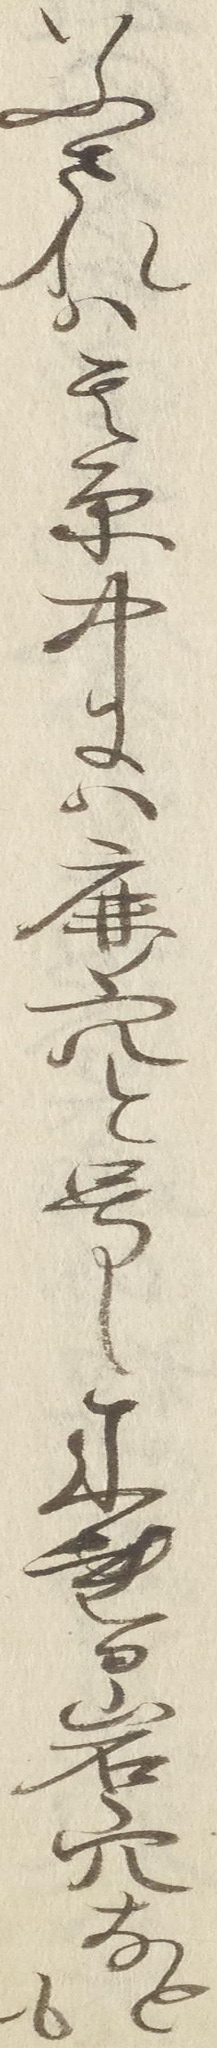いふされは其原中には鹿ノ穴と号し来れる岩穴なとも
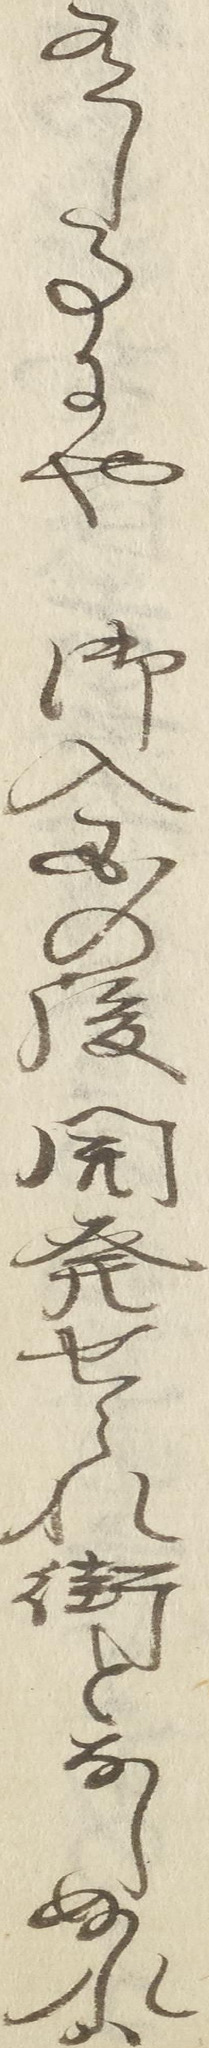有し事にや御入国の後開発せられ街となしぬれは
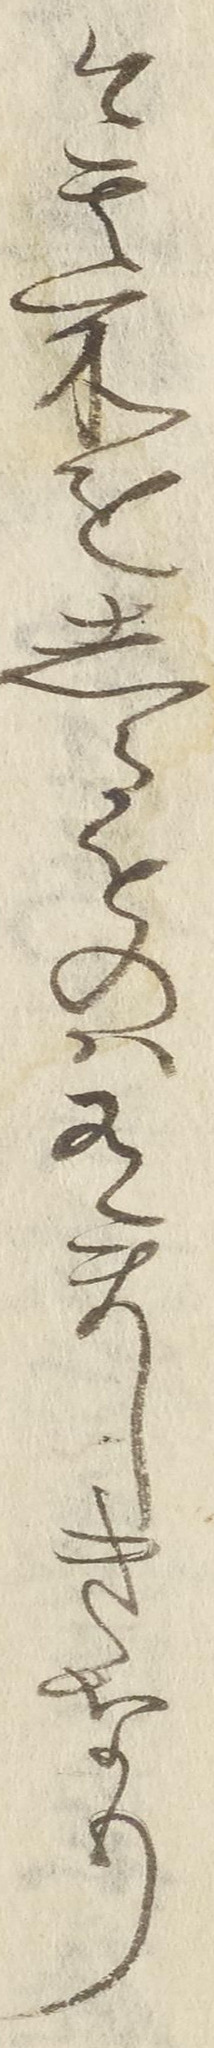今其所をしるものは有ましきなり

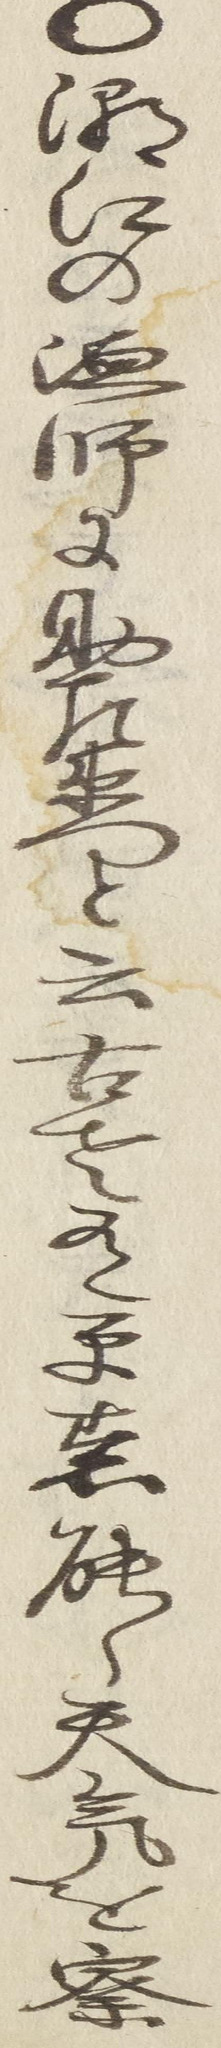〇潮江の漁師に助左衛門と云古老有平素能く天気を察
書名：地震記　上
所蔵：東京大学地震研究所図書室 Earthquake Research Institute Library, The University of Tokyo, JAPAN
